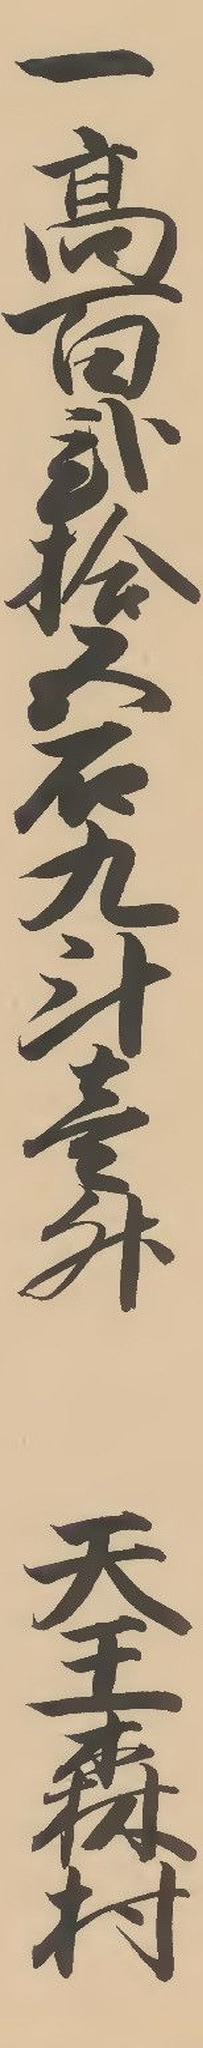一高百弐拾五石九斗壱升天王森村
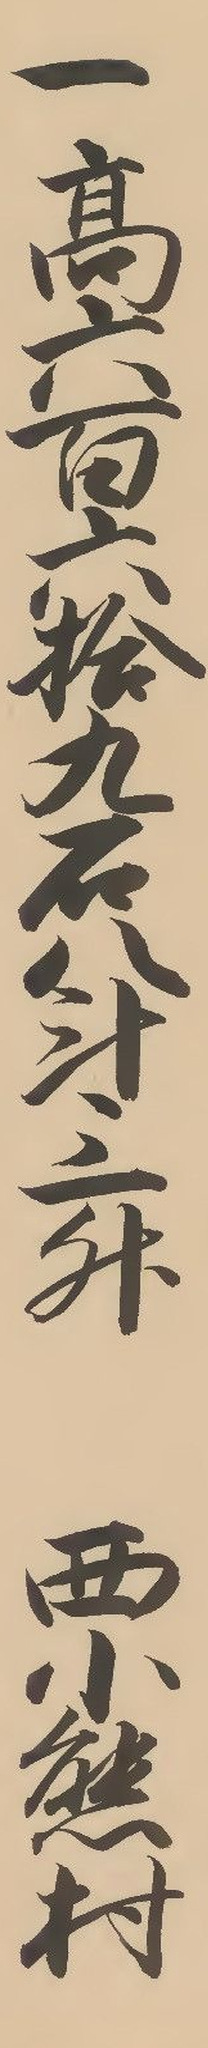一高六百六拾九石八斗三升西小熊村
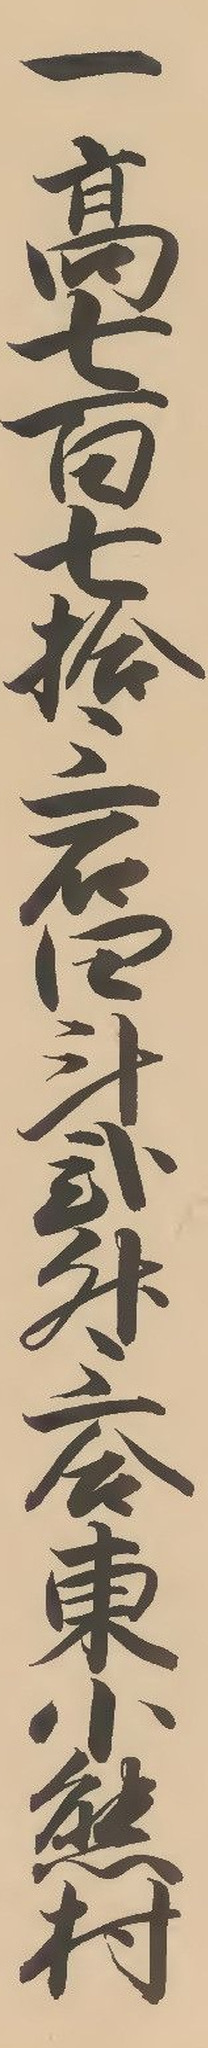一高七百七拾三石四斗弐升三合東小熊村
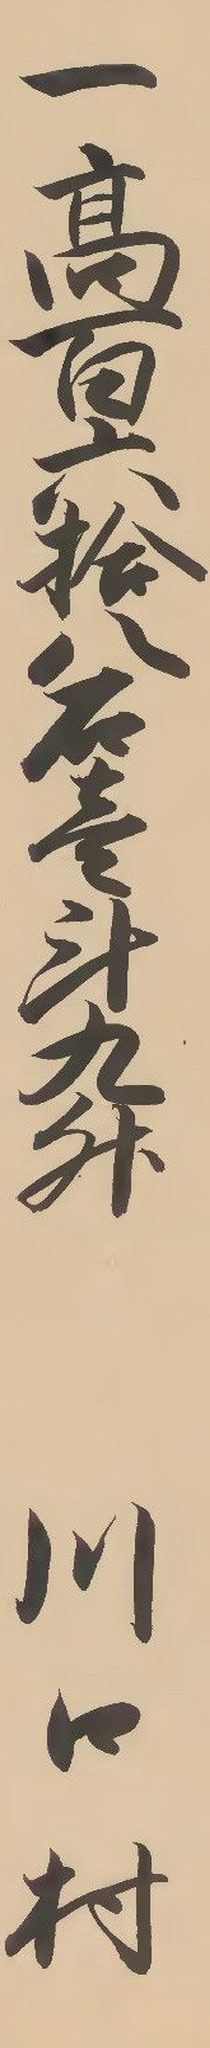一高百六拾八石壱斗九升川口村
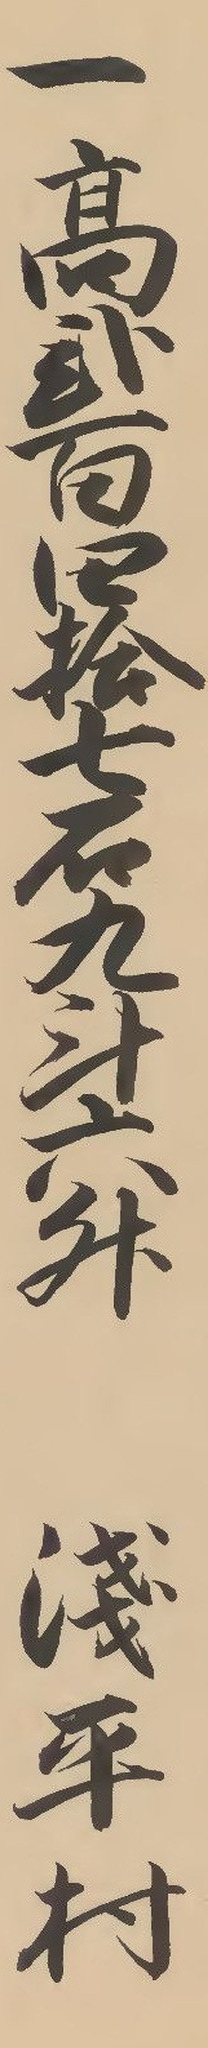一高弐百四拾七石九斗六升浅平村
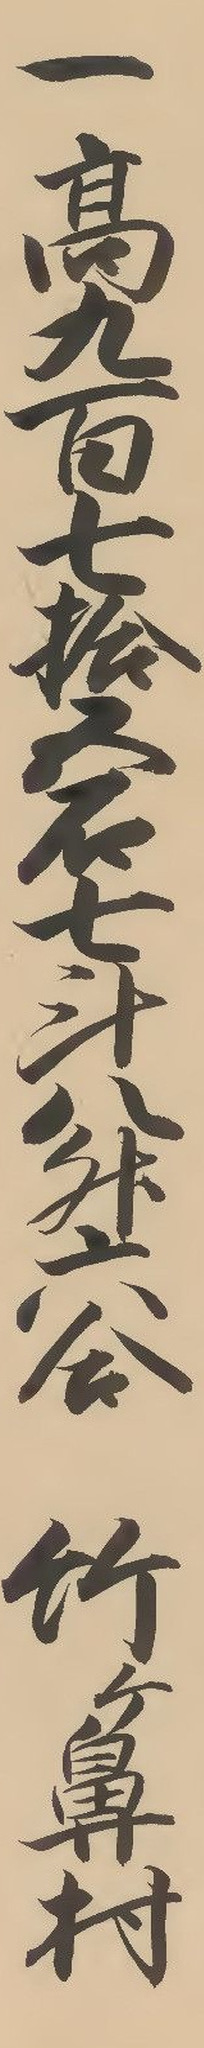一高九百七拾五石七斗八升六合竹ヶ鼻村
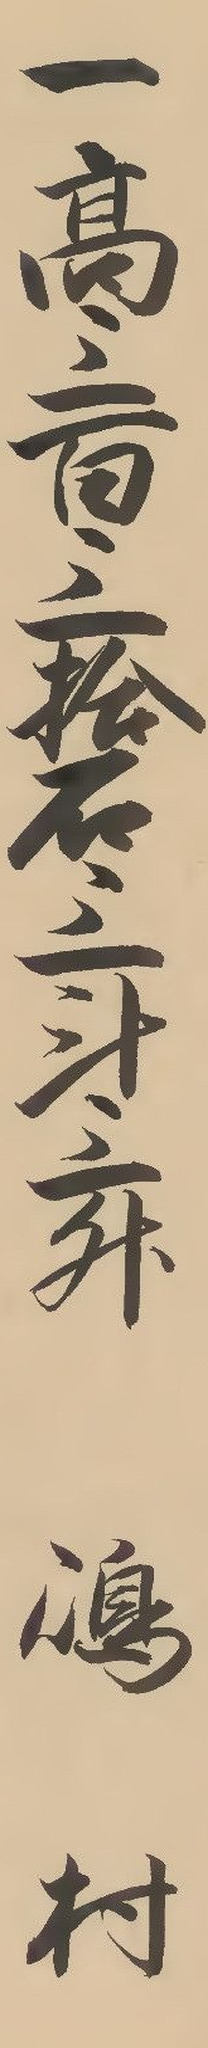一高三百三拾石三斗三升島村
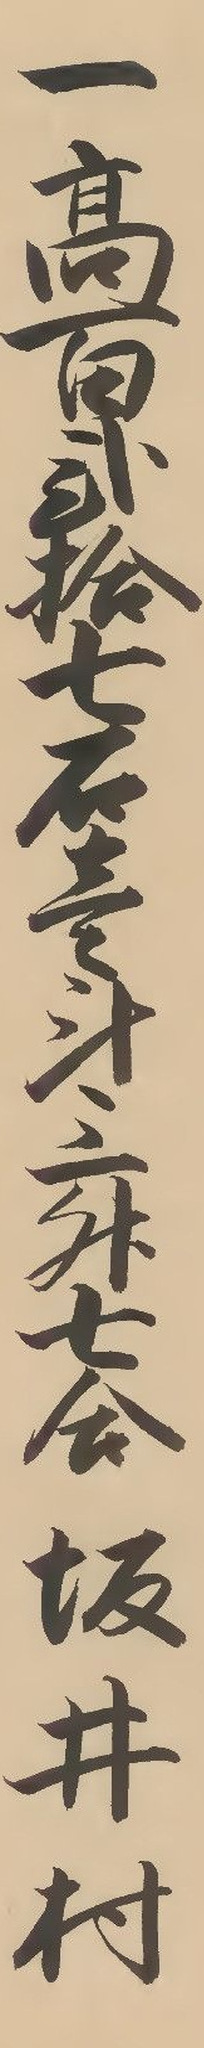一高百弐拾七石壱斗三升七合坂井村

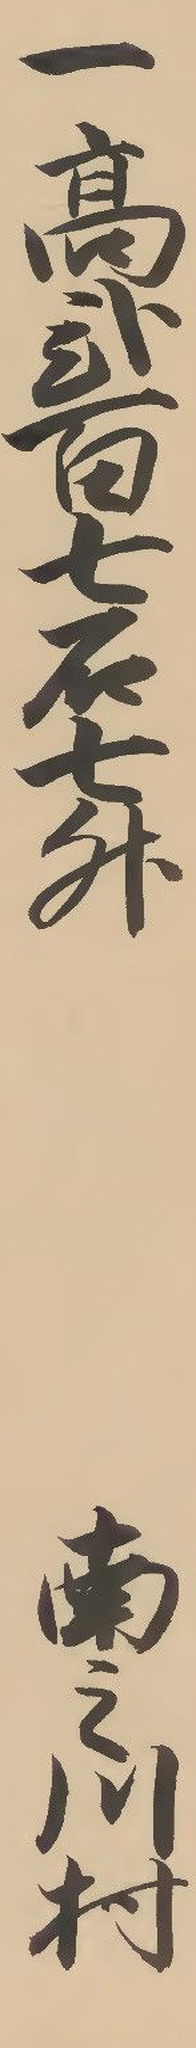一高弐百七石七升南之川村
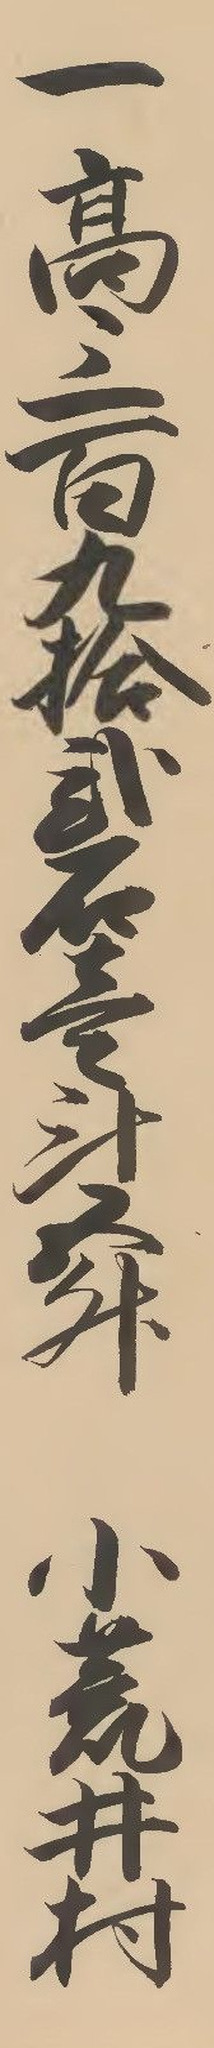一高三百九拾弐石壱斗五升小荒井村
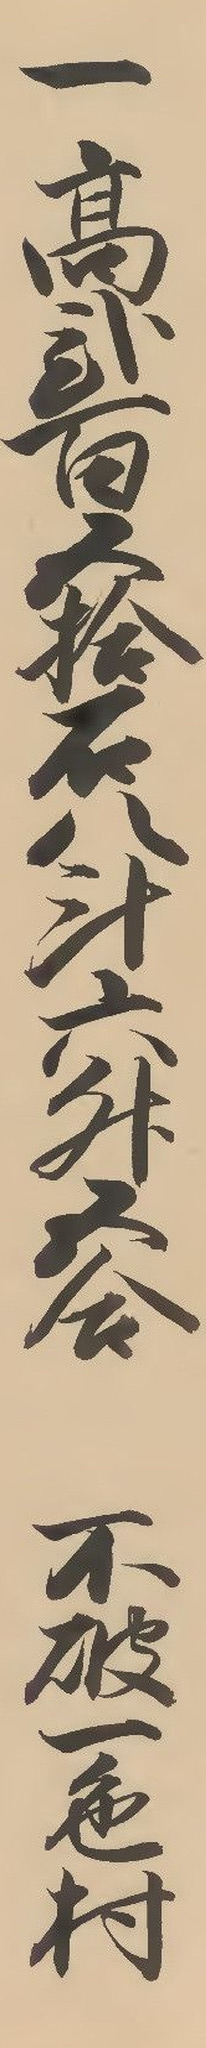一高弐百五拾石八斗六升五合不破一色村
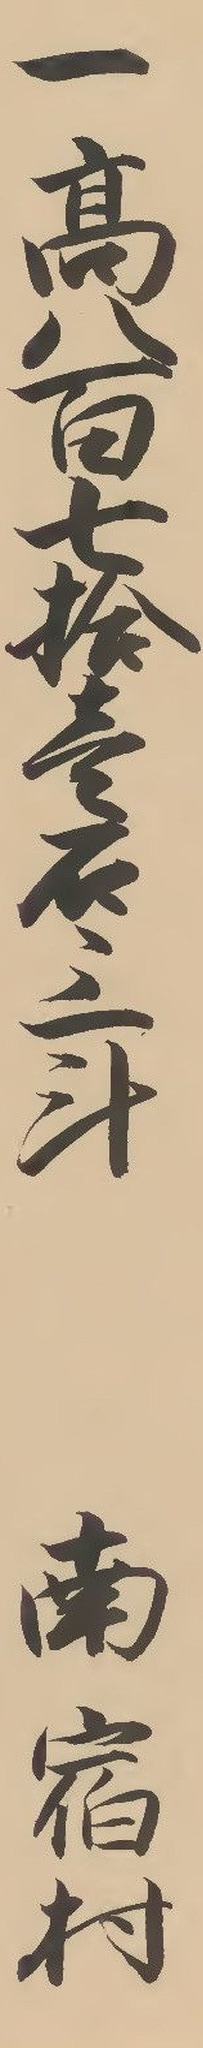一高八百七拾壱石三斗南宿村
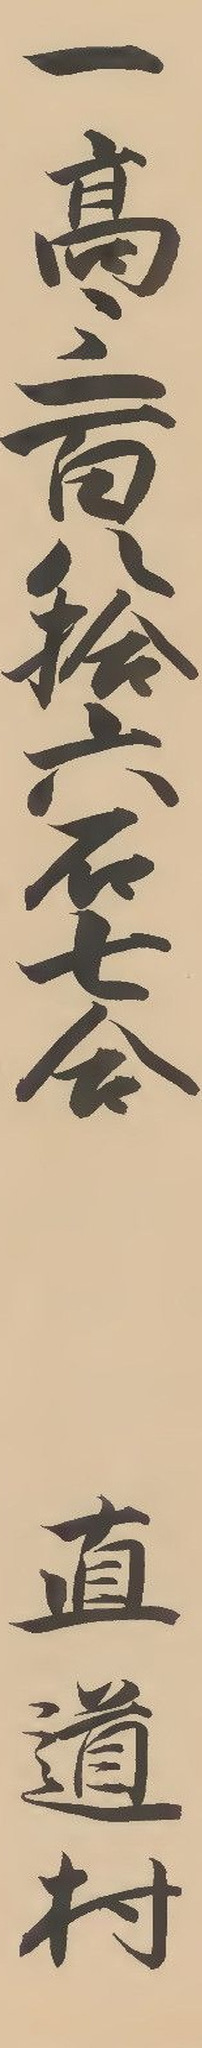一高三百八拾六石七合直道村
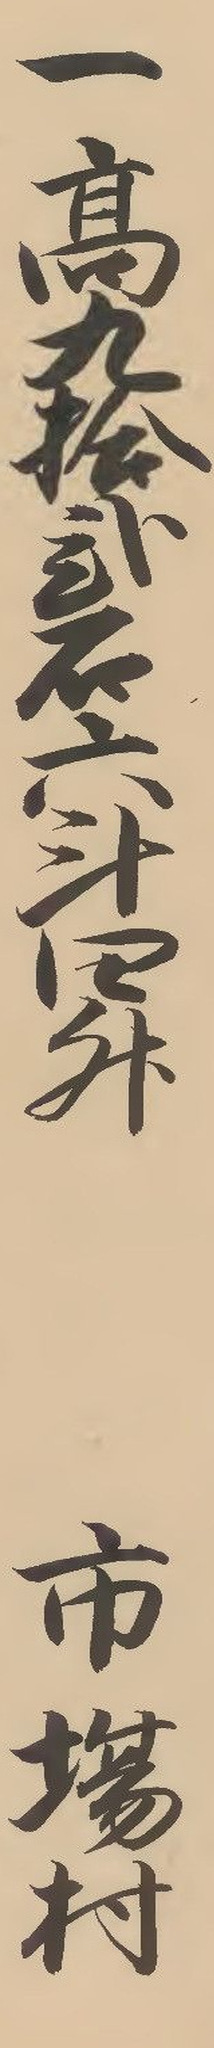一高九拾弐石六斗四升市場村
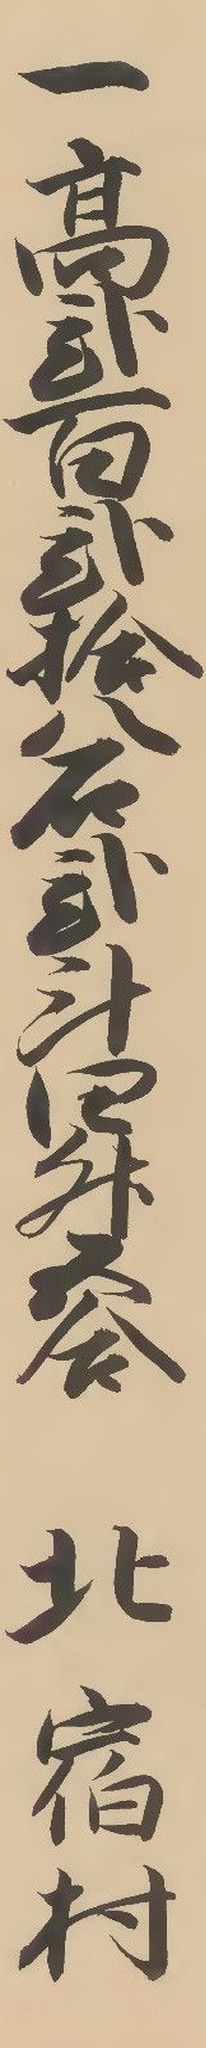一高弐百弐拾八石弐斗四升五合北宿村

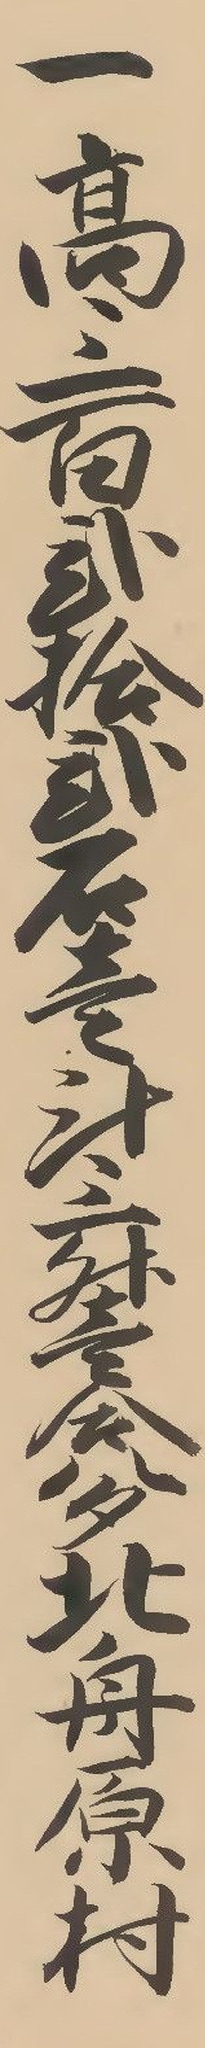一高三百弐拾弐石壱斗三升壱合八勺北舟原村
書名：美濃国郷帳
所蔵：国立公文書館 National Archives of Japan
